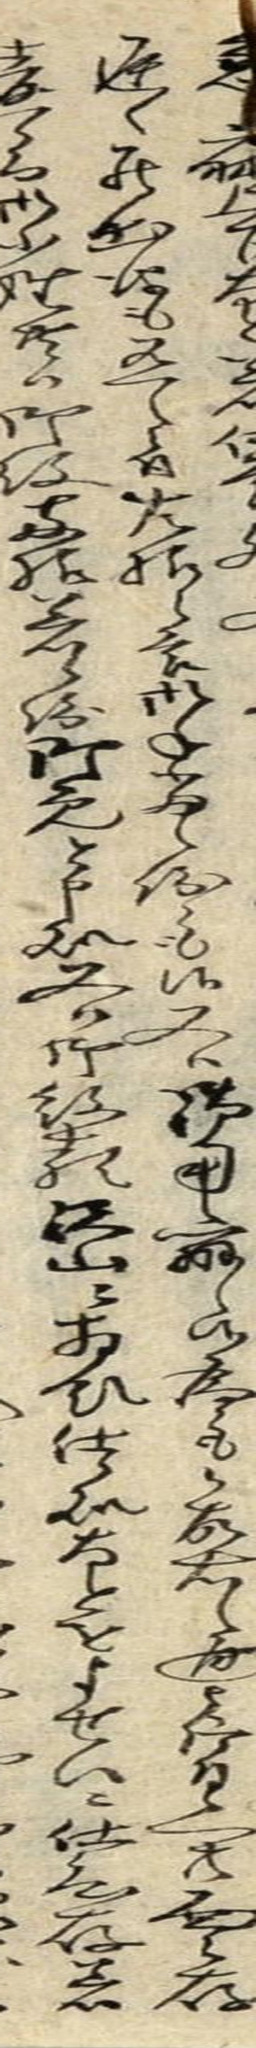違候而御小姓共は御紋両様着候儀御免と申処又は御紋類沢山に拝領仕候処なとをよせいに仕度存着
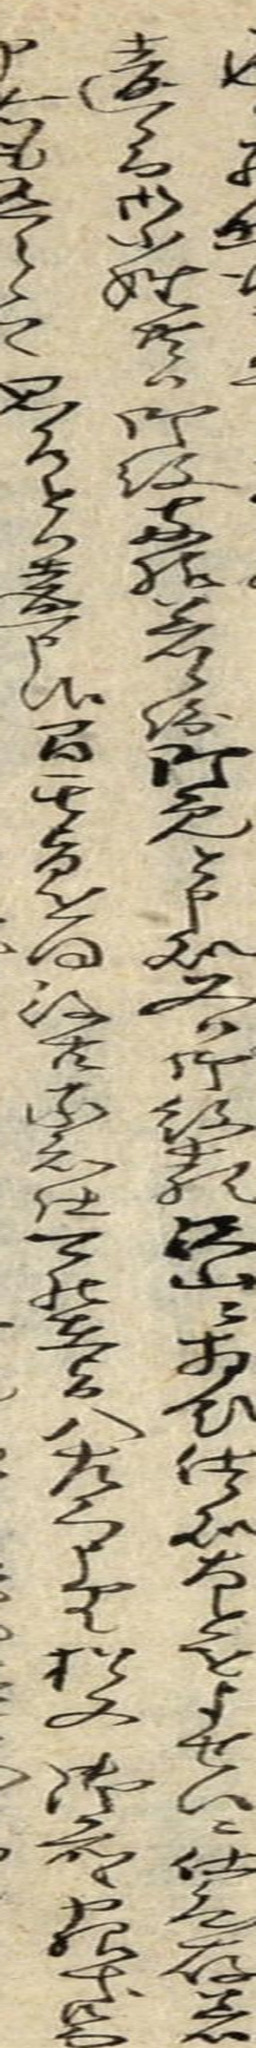申者も有之候はゝ思召とは違申候間其旨を同役共承知仕可罷在旨八左衛門申聞候猶又御前へ中根十郎左衛門
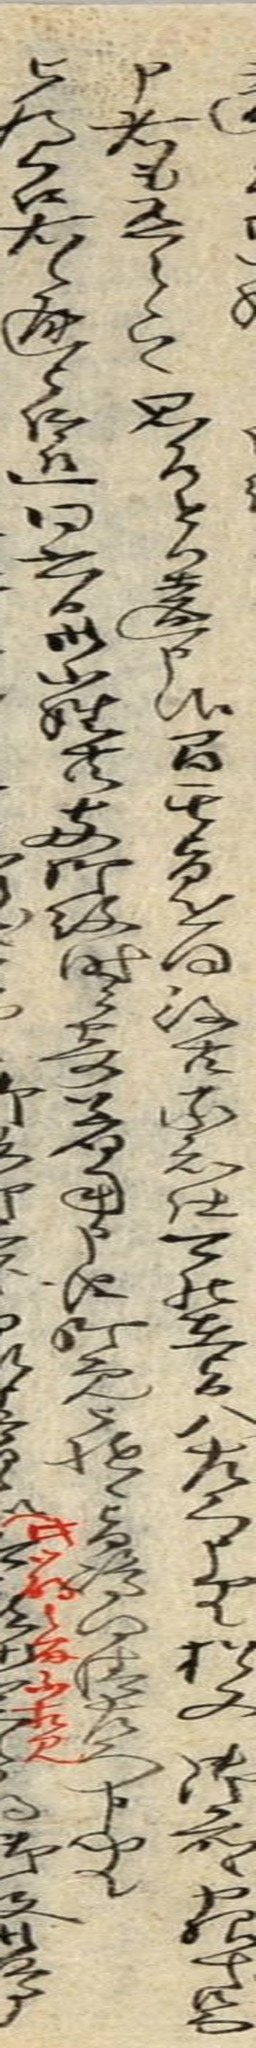被為召右之通被仰付」同六日御小姓共両御紋時に寄着用申儀御免被遊候旨嶋田清左衛門申聞候
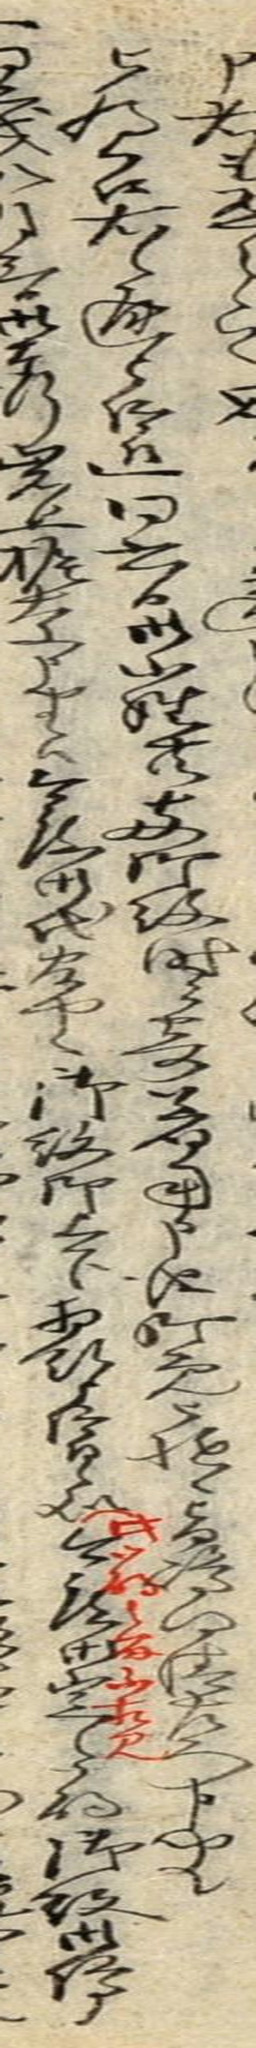一同二戌八月三日御奉行岩上梶太夫申聞候は今度御代官中へ御紋御上下拝領被仰付候処今度御定之御触御紋御停
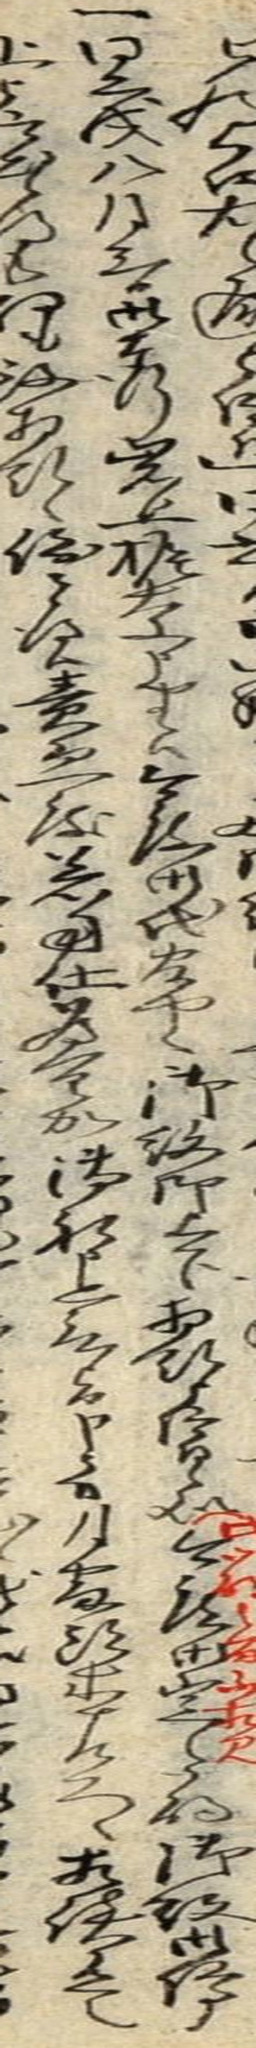止被仰出候得共何も致拝領候儀侯得は責て一度着用仕為冥加御礼申上度旨申に付月番鈴木十左衛門へ相談有之
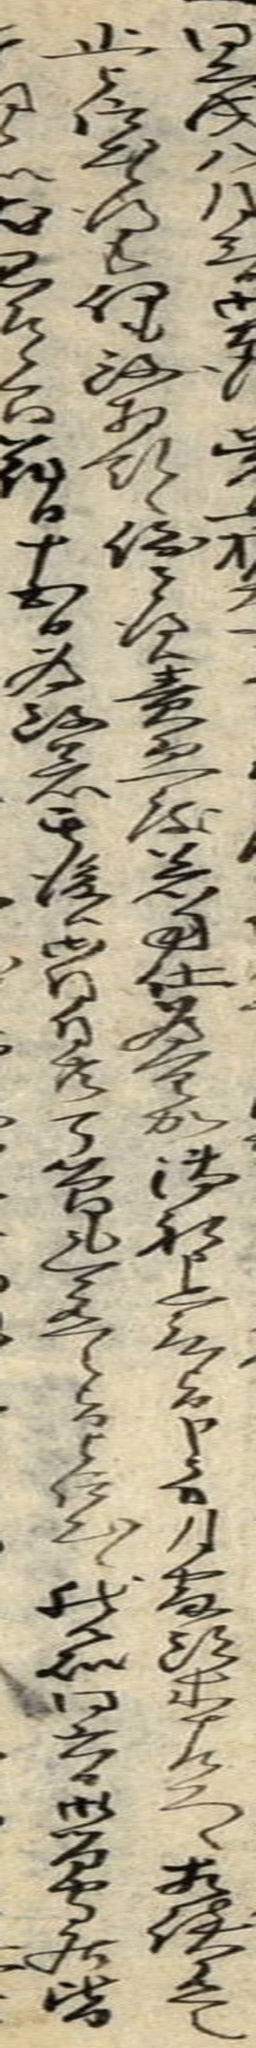奉伺候処尤思召候間朔日十五日為致着其後は御目付共了簡も可有之旨被仰出候然る処同六日御留守居皆
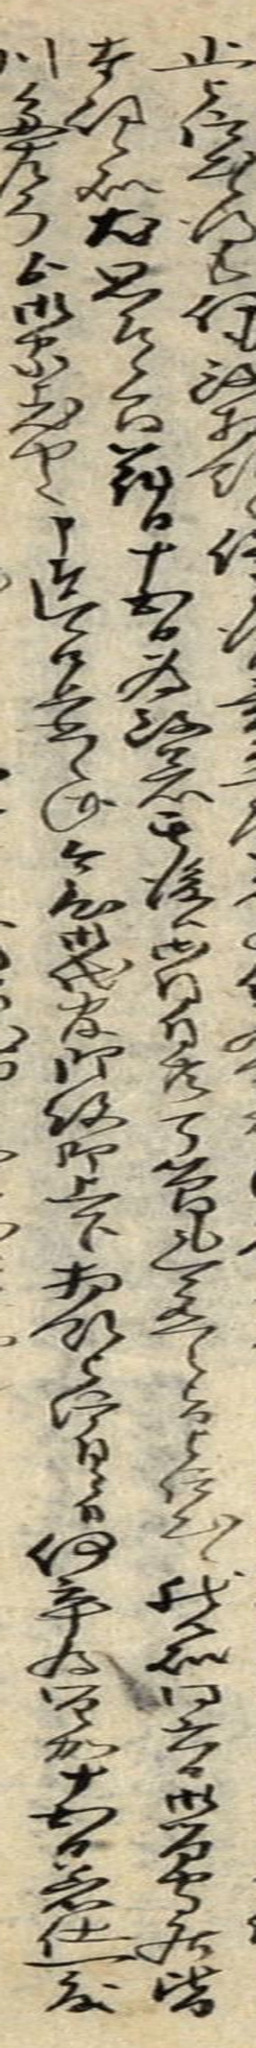川多左衛門ゟ御家老中へ申達候口上書之趣今度御代官御紋御上下拝領被仰付候に付何卒為冥加十五日着仕一度
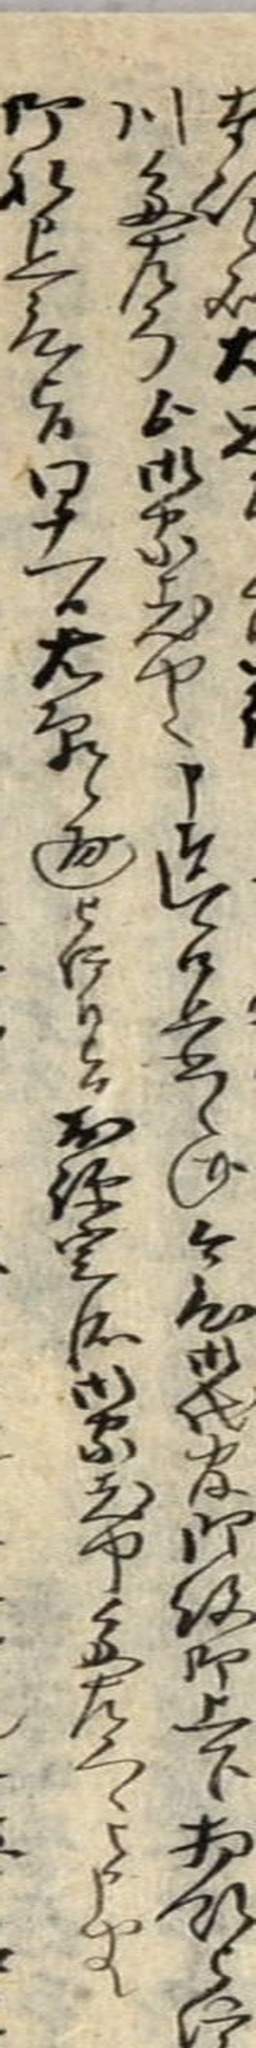御礼申上度旨同十一日右願之通被仰付候旨於評定所御家老中多左衛門へ被申聞候
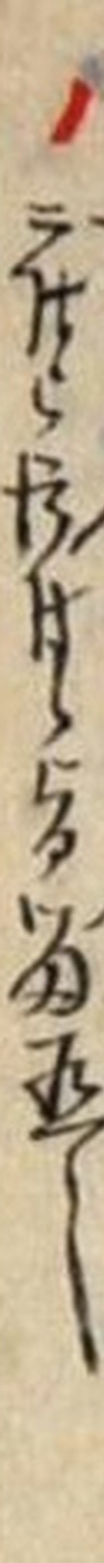に付被仰付候旨留有之

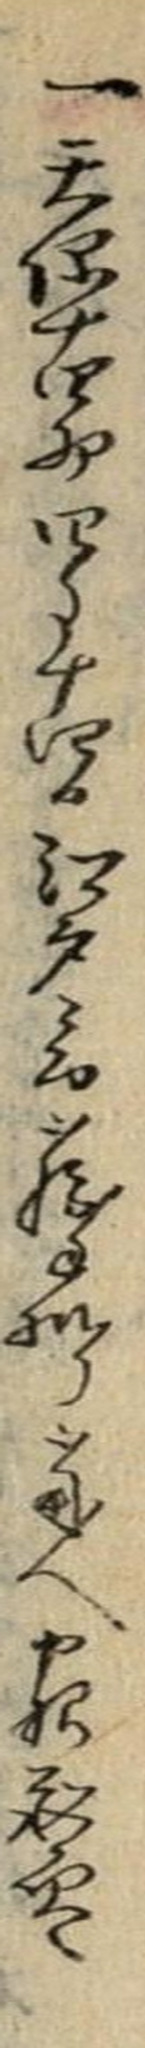一天保十四卯四月十四日江戸に而御勝手掛り御用人中根靭負へ
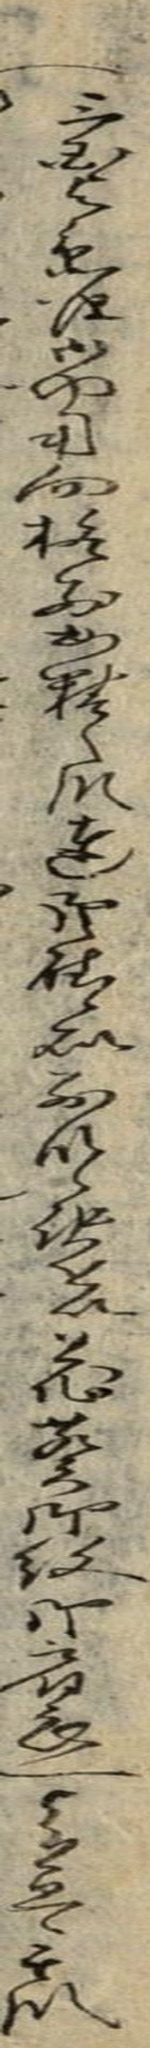三国与兵衛儀御内用向格別出精之段達御聴候処別段之訳を以花葵御紋御肩衣一被下置候其段
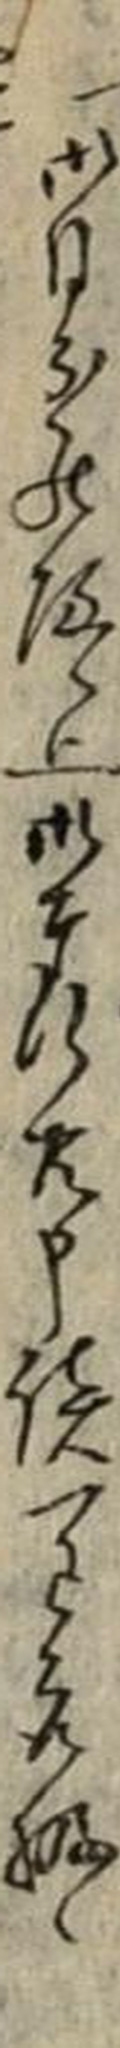御自分罷帰候上御奉行共申談可被取扱候
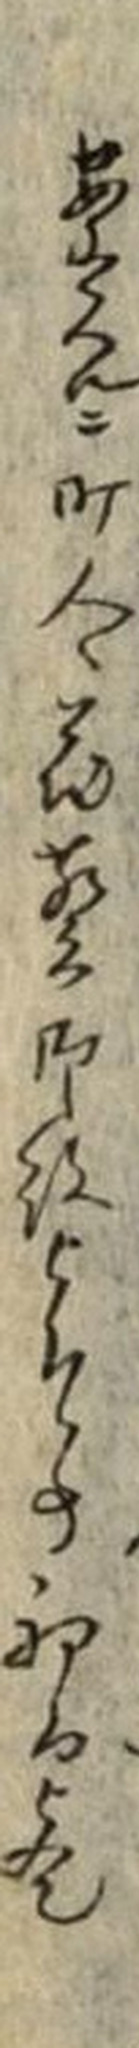案するに町人へ花葵御紋被下候事初而歟
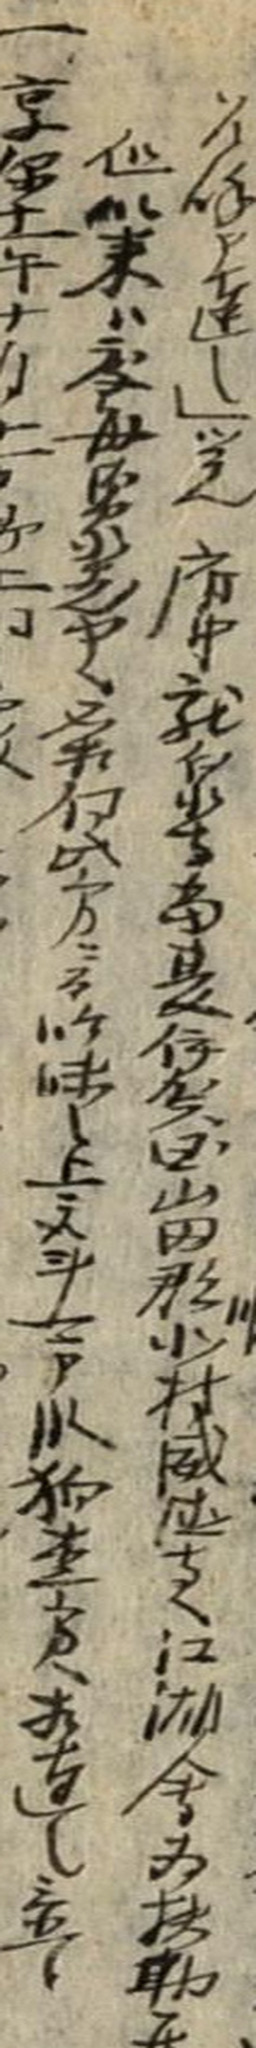但以来は度毎御家老中へ不相伺付此方に而吟味之上取斗可申段狛木工方へ相達之置候
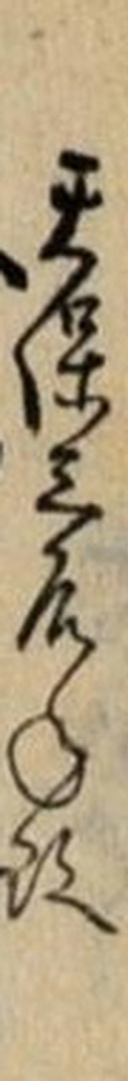天保三辰年改
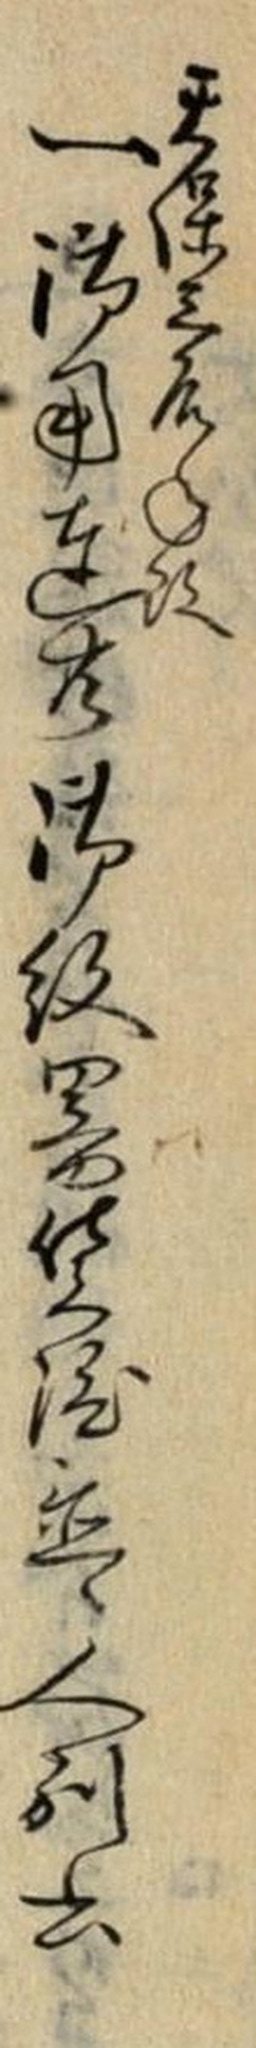一御用達共御紋器貸渡置候人別書
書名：蒐輯之部
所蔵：福井県文書館 Fukui Prefectural Archives
